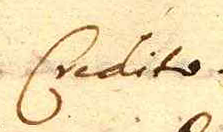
Credito.
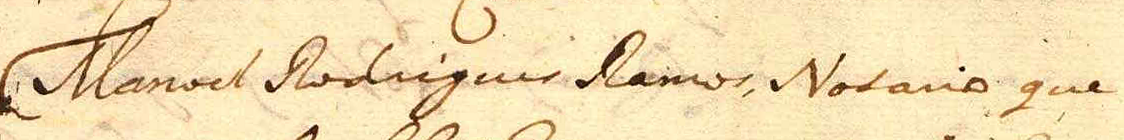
Manoel Rodrigues Ramos, Notario que
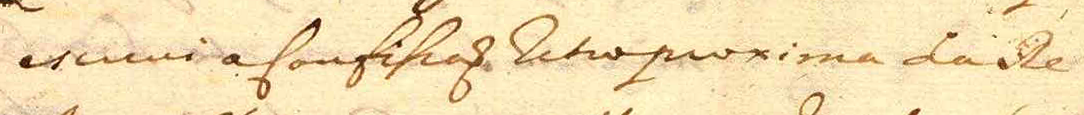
escreui a Confissaõ Retro proxima da Ré
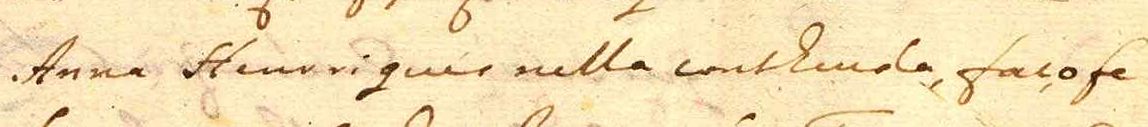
Anna Henrriques nella contheuda, faço fe
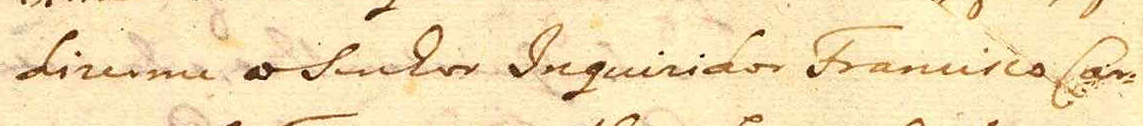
dizerme o Senhor Inquizidor Francisco Car
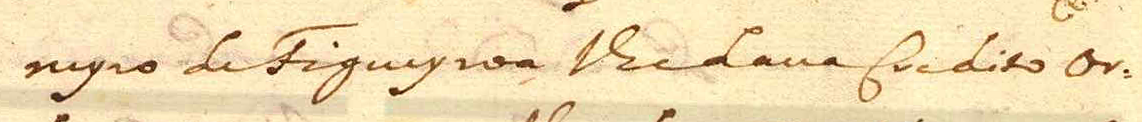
neyro de Figueyroa lhe daria Credito or
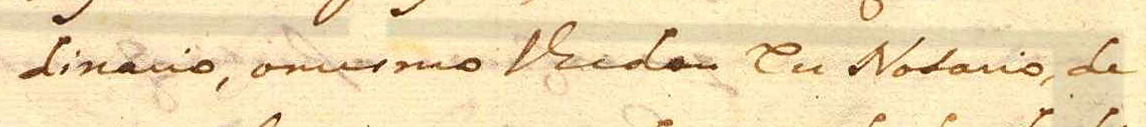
dinario, o mesmo lhe dou Eu Notario, de
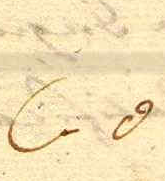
C o
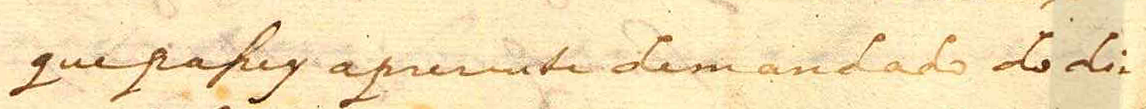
que passey a prezente de mandado do di
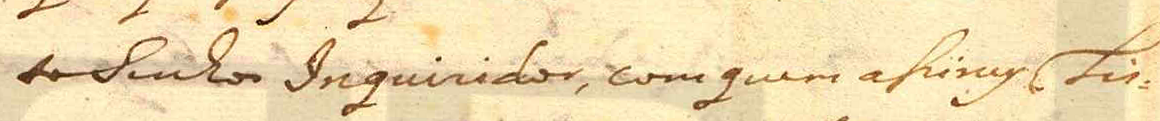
to Senhor Inquizidor, com quem assiney Lis
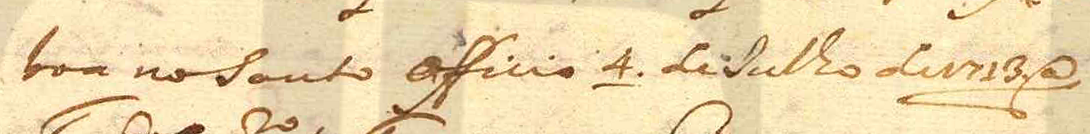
boa no santo officio 4. de Iulho de 1713. ā
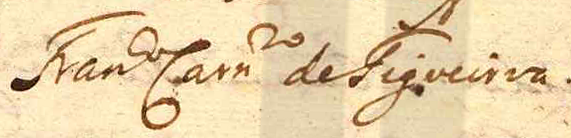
Franco Carnro de Figueiroa
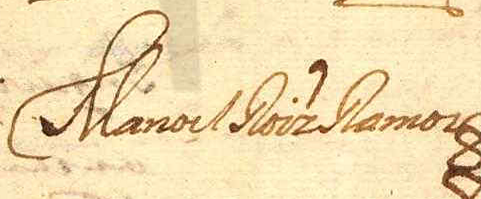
Manoel Roiz̄ Ramoz
